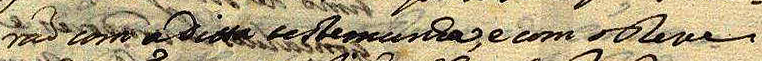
raõ com a ditta testemunha, e com o Reve
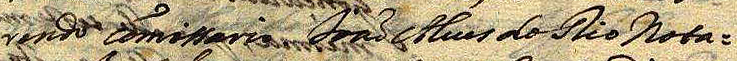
rendo comissario Ioaõ Alues do Rio Nota
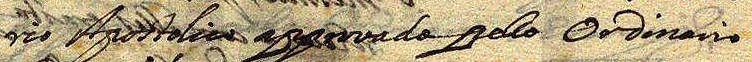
rio Apostolico approvado pello Ordinario
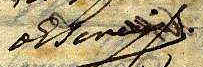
o Escreuj.
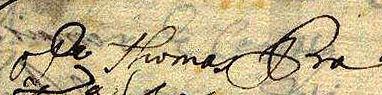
o Pe Thomas Pra
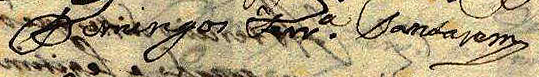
Domingos Ferra. Santarem
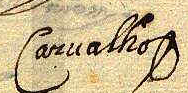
Carualho
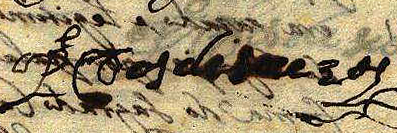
o Pe Dos de souza
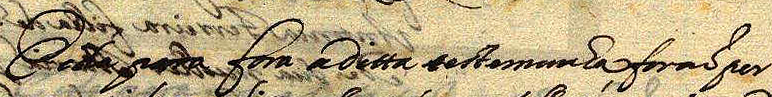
E ida para fora a ditta testemunha foraõ per
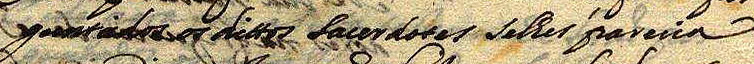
guntados os dittos sacerdotes se lhes parecia
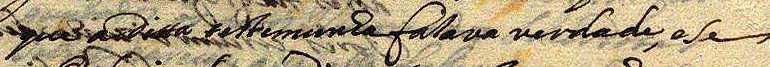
que a ditta testemunha falava verdade, e se
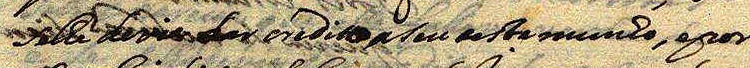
se lhe devia dar credito a seu testemunho, e por
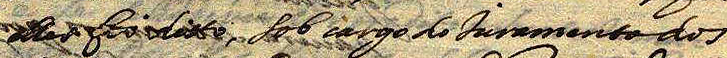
elles foi ditto, sob cargo do Iuramento dos
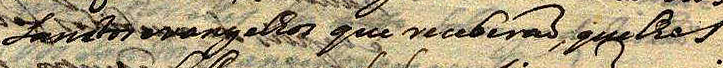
sanctos evangelhos que receberaõ, que lhes
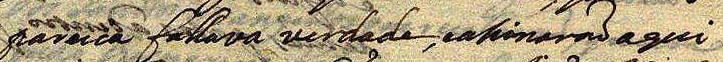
parecia fallava uerdade, e assinaraõ aqui
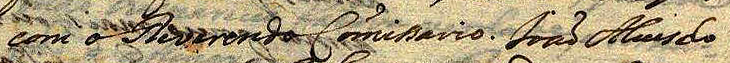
com o Reverendo Comissario. Ioaõ Alues do
